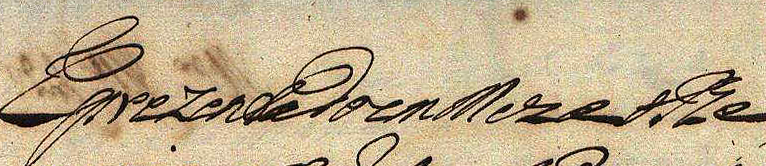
E prezentado em Meza o Re
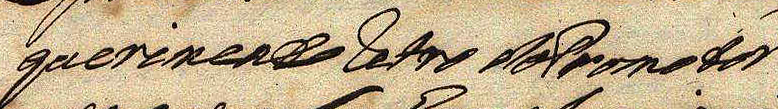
querimento Retro do Promotor
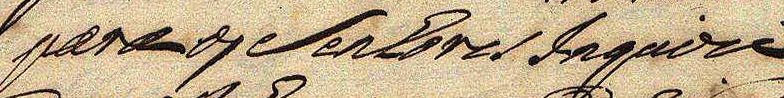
para os Senhores Inquizi
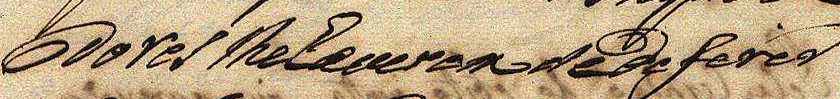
dores lhe haveram de deferir
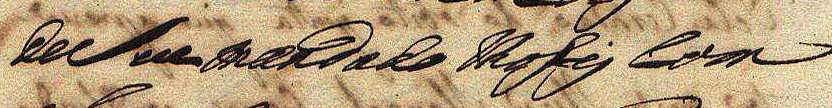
de Seu mandado lho fes Com
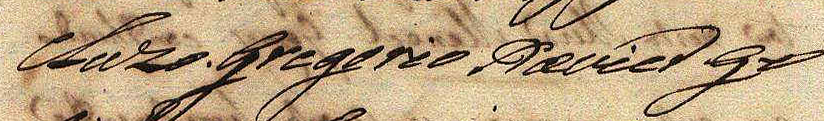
cluzo Gregorio Xavier go
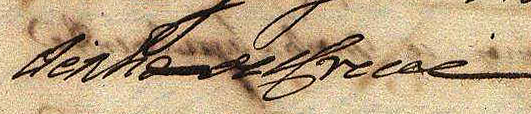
denho o esCreui
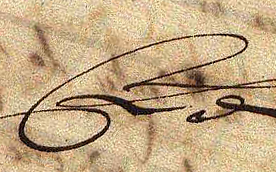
CLo
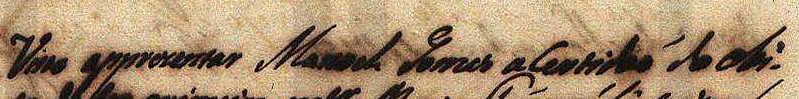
Visto apprezentar Manoel Gomes a Certidaõ do obi
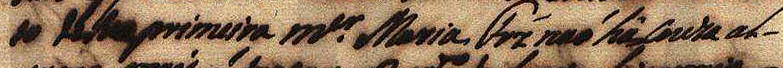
to desta primeira m.er Maria Frz̄ naõ há Couza al
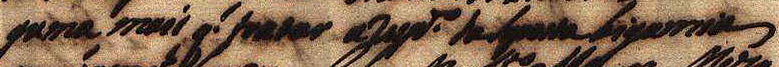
guma mais p̄. tratar a Just.o da Suposta bigamia
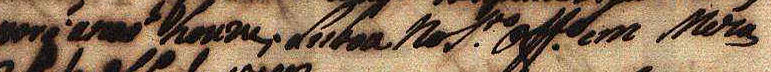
porq̄ a naõ houve; Lisboa no s.to off.o em Meza
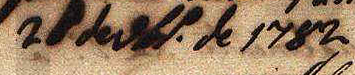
28 de 9br.o de 1782
